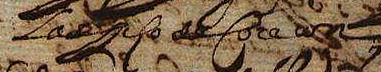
las hizo de Coraçon
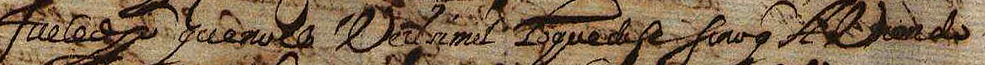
fuele dhō que no es Verisimel Lo que dize sino q̄ AViendo
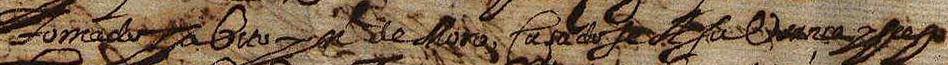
tomado habito y no de Moro, Casādose A su Vsança y hecho
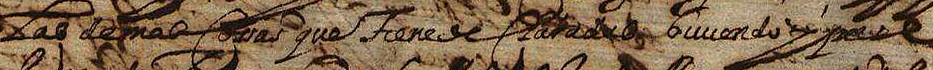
Las demas Cossas que tiene deClaradas, biuiendo y perse
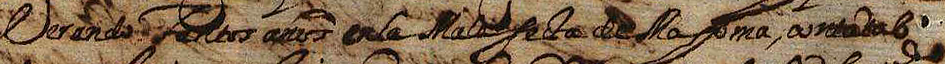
Verando tantos anōs en la Mala secta de Mahoma, con tātas
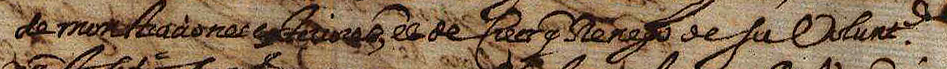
demonstraciones exteriores, es de Creer q̄ Renego de su Voluntd
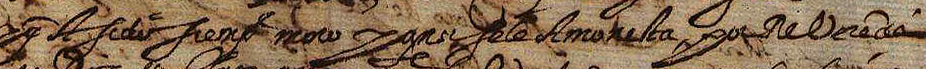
y q̄ A sido siempe moro y ansi se le Amonesta, por ReVerēcia
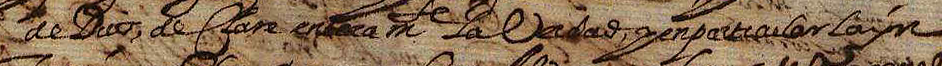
de Dios, deClare enteramte la Verdad, y en particular la yn
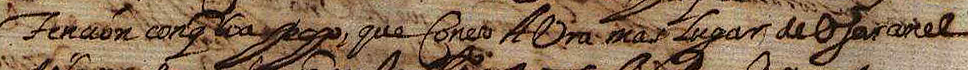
tencion con q̄ lo a hecho, que Con eso AVra mas lugar de vsar con el
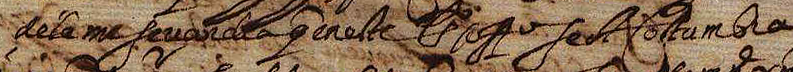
de la misericordia q̄ en este sto offo se ACostumbra
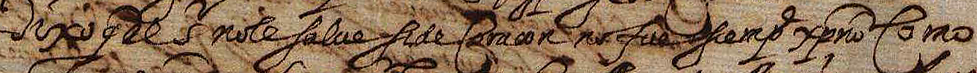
Dixo q̄ el Sr no le salue si de Coraçon no fue siempe xpn̄o Como
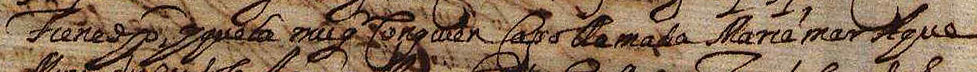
tiene dhō, y que la mugr Con quien Casso llamada Mariāmar A que
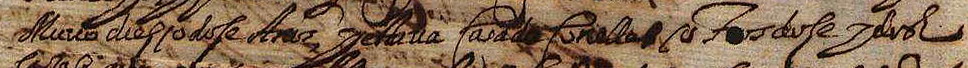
Murio diez o doze Anōs, y estaua Casado Con ellas otros doze y dos
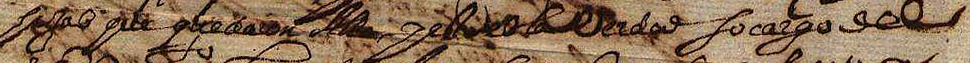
hijos que quedaron Alla, y esta es la Verdad so cargo del
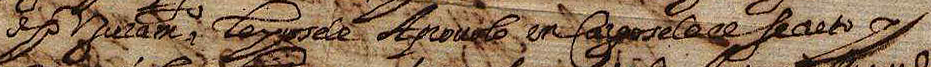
dhō Juramto, Leyosele Aprouolo enCargosele el secreto y
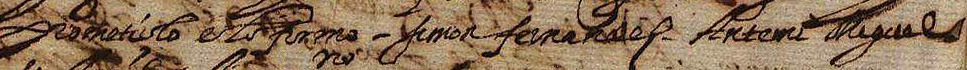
prometiolo, e Lo firmo - simon fernandez. Ante mi Miguel
